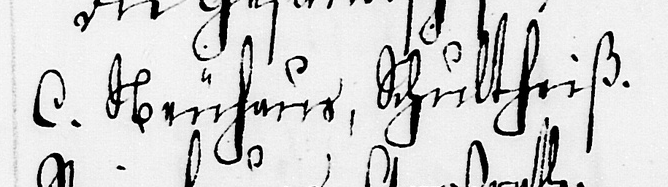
C. Neuhaus, Schultheiß.
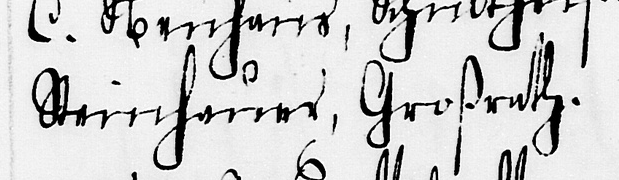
Steinhauer, Großrath.
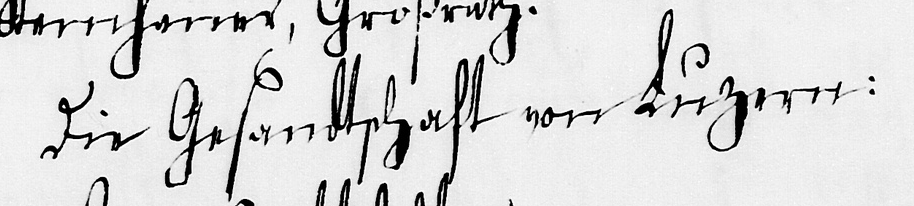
Die Gesandtschaft von Luzern:
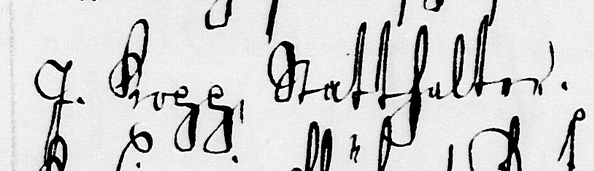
J. Kopp, Statthalter.
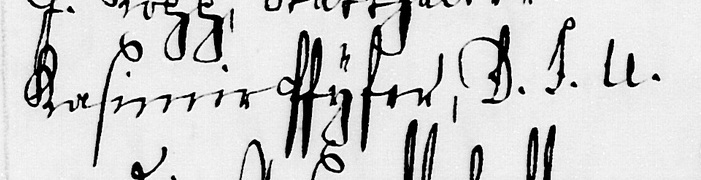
Kasimir Pfyfer, D. I. U.
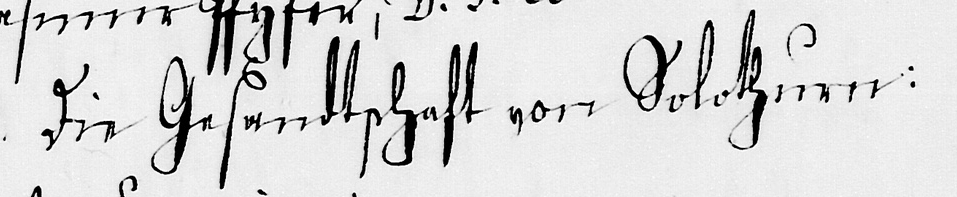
Die Gesandtschaft von Solothurn:
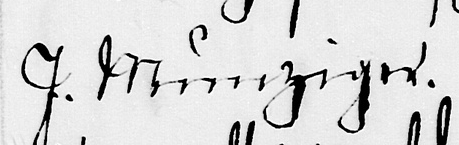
J. Munziger.
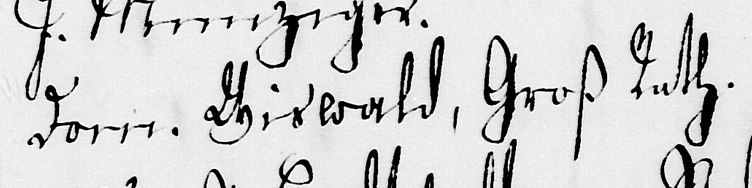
Dom. Wiswald, Groß Rath.
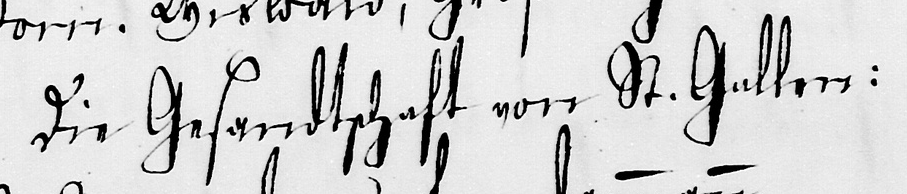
Die Gesandtschaft von St. Gallen:
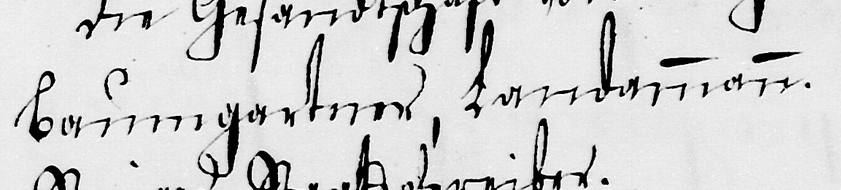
Baumgartner, Landammann.
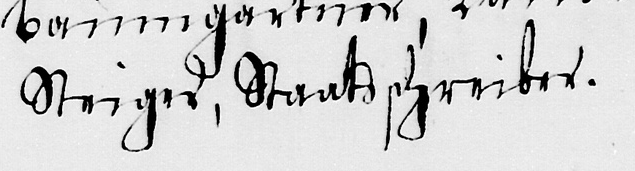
Steiger, Staatsschreiber.
